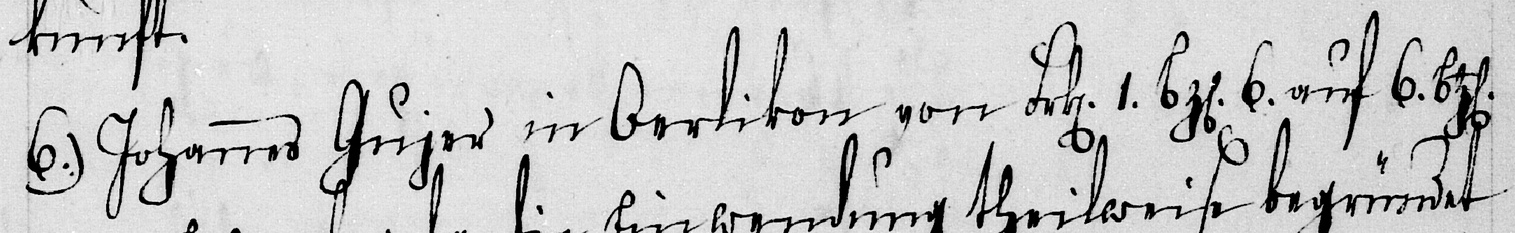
6.) Johannes Gujer in Oerlikon von Frk[en]. 1. Btz[en].
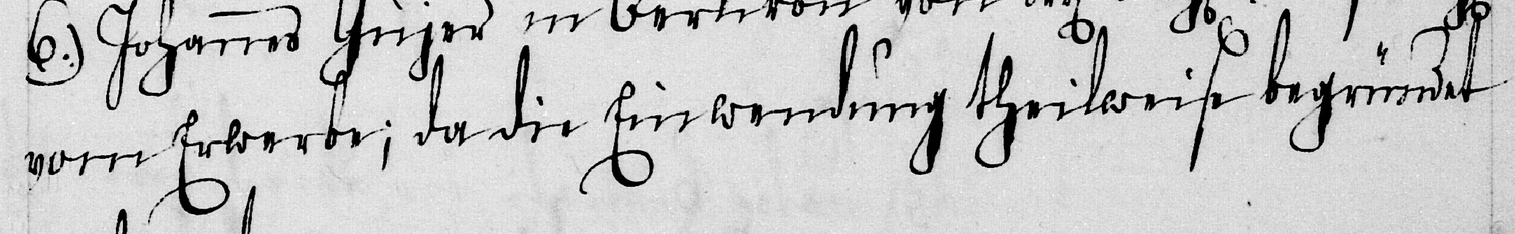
vom Erwerbe; da die Einwendung theilweise begründet
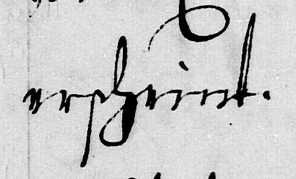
erscheint.
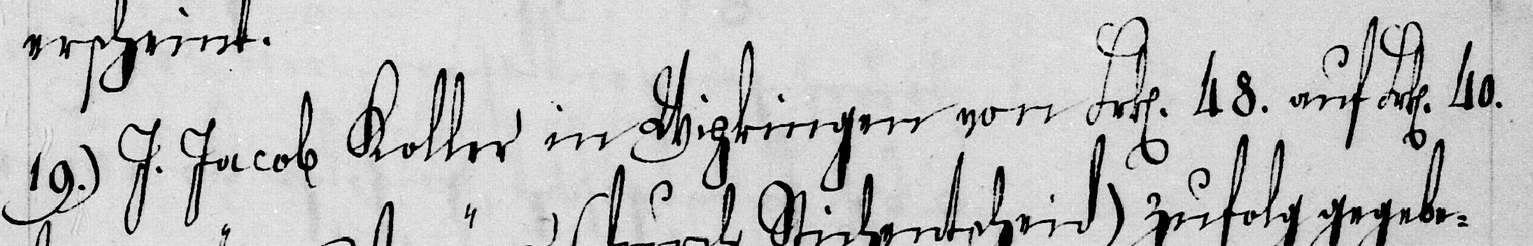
19.) J. Jacob Koller in Wipkingen von Frk[en]. 48.
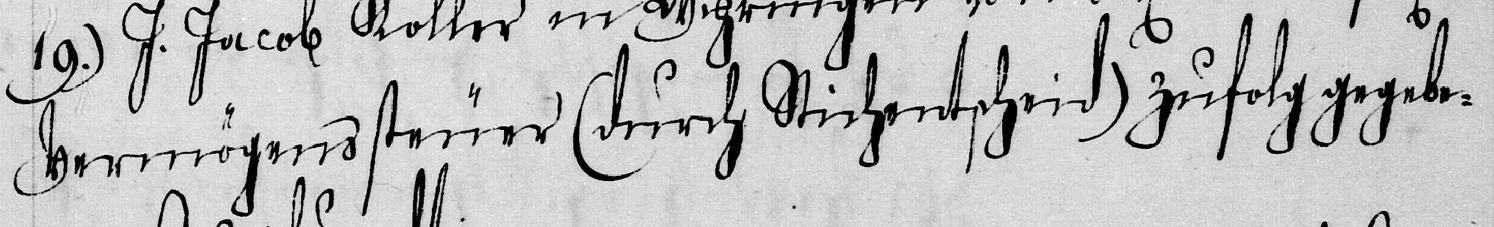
Vermögenssteuer (durch Stichentscheid) zufolg gegebe¬
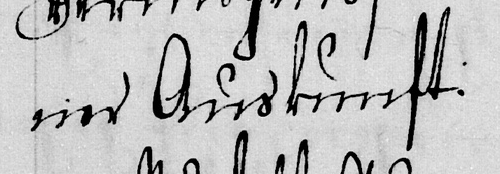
ner Auskunft.
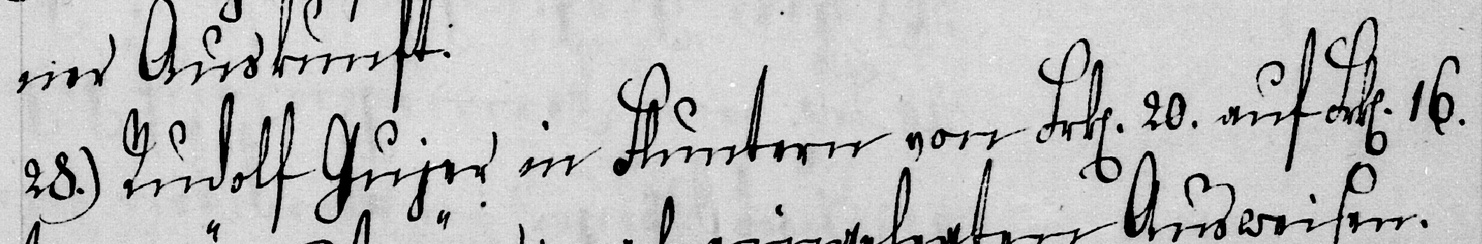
28.) Rudolf Gujer in Fluntern von Frk[en]. 20.
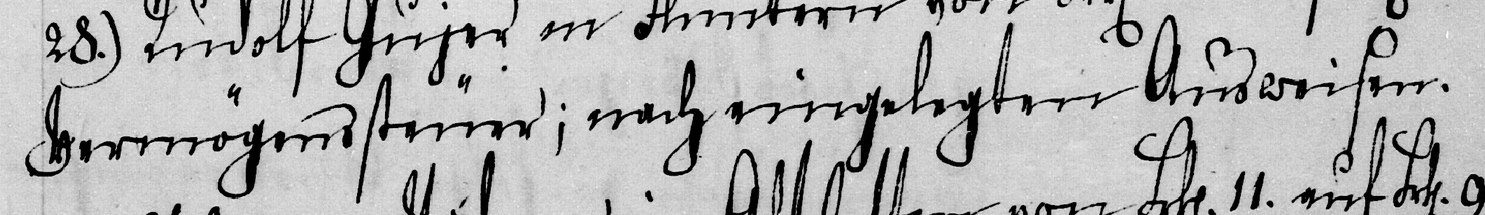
Vermögenssteuer; nach eingelegten Ausweisen.
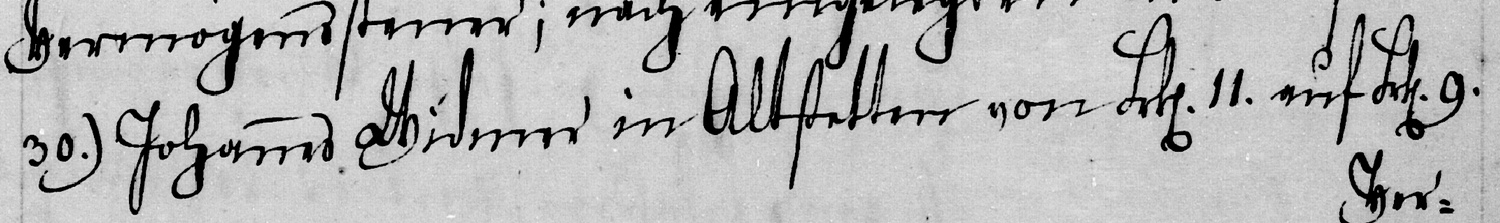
30.) Johannes Widmer in Altstetten von Frk[en]. 11.
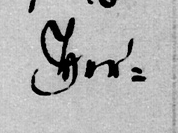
Ver¬
